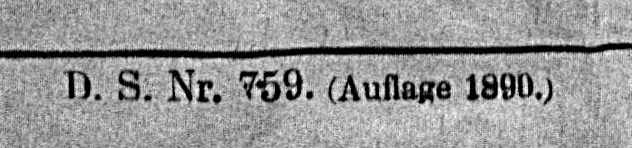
D. S. N° 759. (Auflage 1890.)
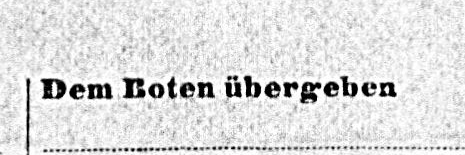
Dem Boten übergeben
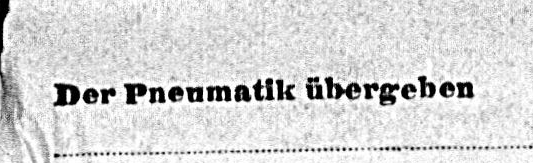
Der Pneumatik übergeben
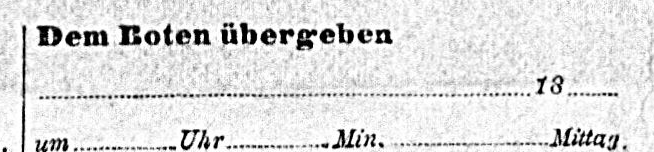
...............18......
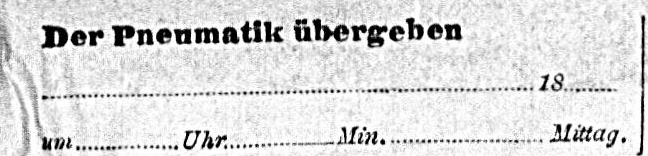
...............18......
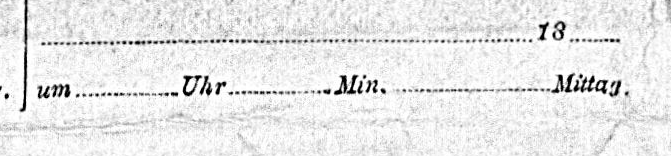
um.........Uhr.....Min...... Mittag.
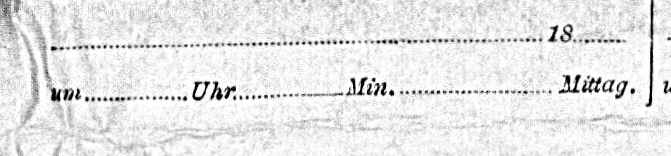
um.........Uhr.....Min...... Mittag.
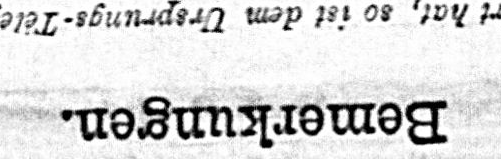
Bemerkungen.
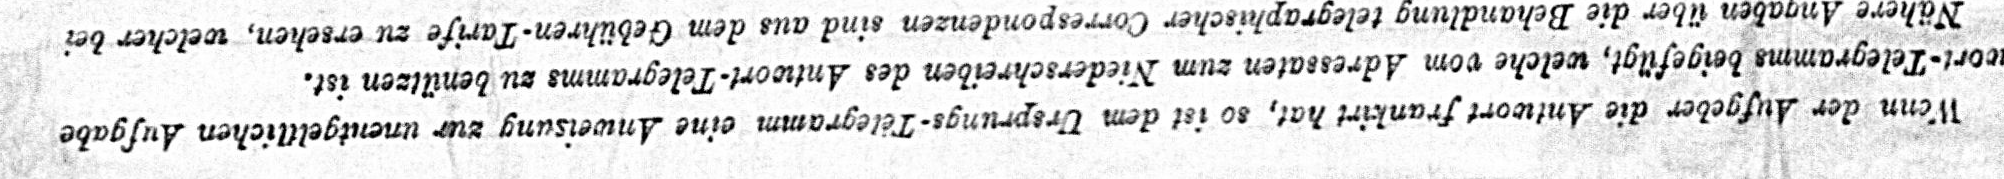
Wenn der Aufgeber die Antwort frankirt hat, so ist dem Ursprungs-Telegramm eine Anweisung zur unenigelilichen Aufgabe
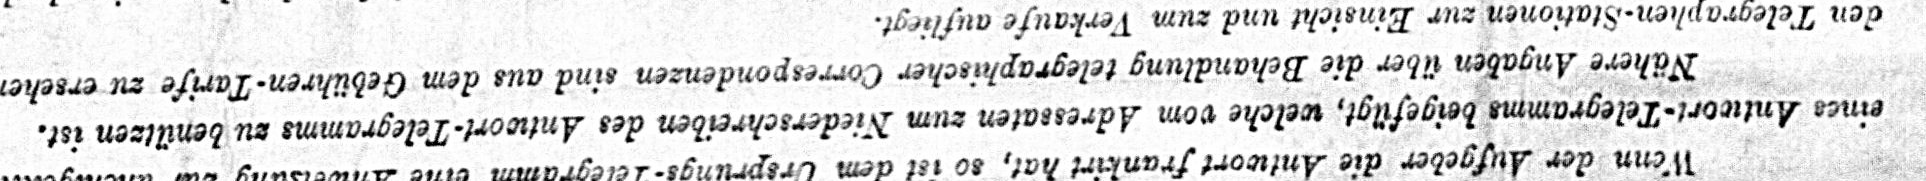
eines Antwort-Telegramms beigefügt, welche vom Adressaten zum Niederschreiben des Antwort-Telegramms zu benützen ist.
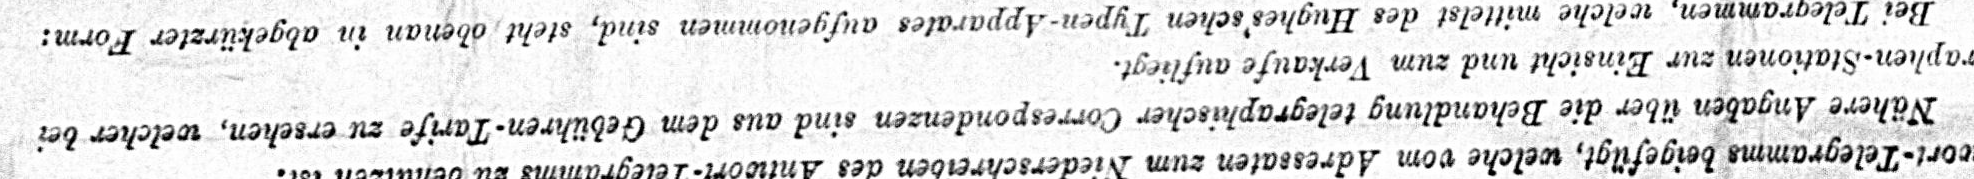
Nähere Angaben über die Behandlung telegraphischer Correspondenzen sind aus dem Gebühren-Tarife zu ersehen, welcher bei
